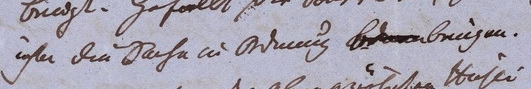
ihm die Sache in Ordnung bringen.
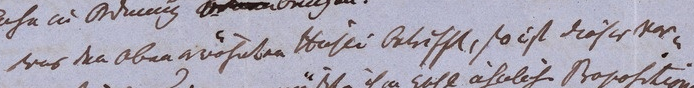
Was den Oben erwähnten Hüssi betrifft, so ist dieser ver-
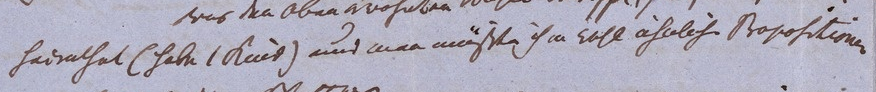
heirathet (habe 1 Kind) und man müßte ihm wohl ähnliche Propositionen
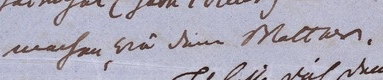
machen wie dem Blattner
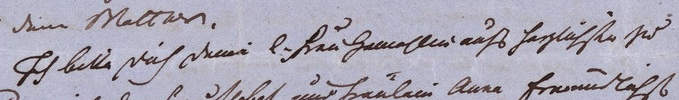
Ich bitte Dich deine l. Frau Gemahlin aufs herzlichste zu
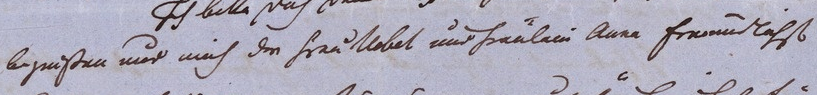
begrüßen und mich der Frau Uebel und Fräulein Anna freundlichst
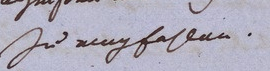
zu empfehlen.
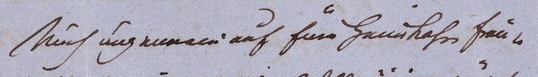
Mich ungemein auf Eure Heimkehr freu-
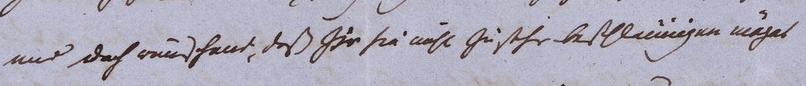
end doch wünschend, daß Ihr sie nicht zu sehr beschleunigen möget
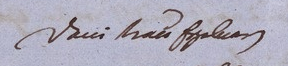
Dein treu Ergebner
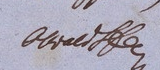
Oswald Heer
